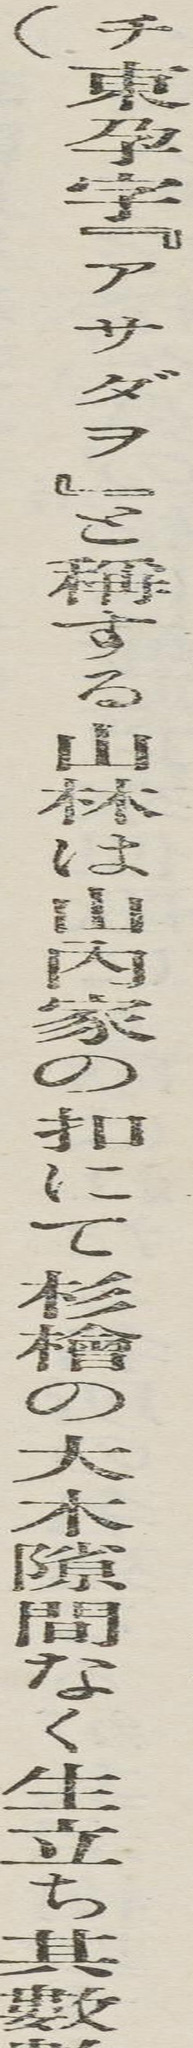東孕字『アサダヲ』と称する山林は山内家の扣にて杉桧の大木隙間なく生立ち其数数
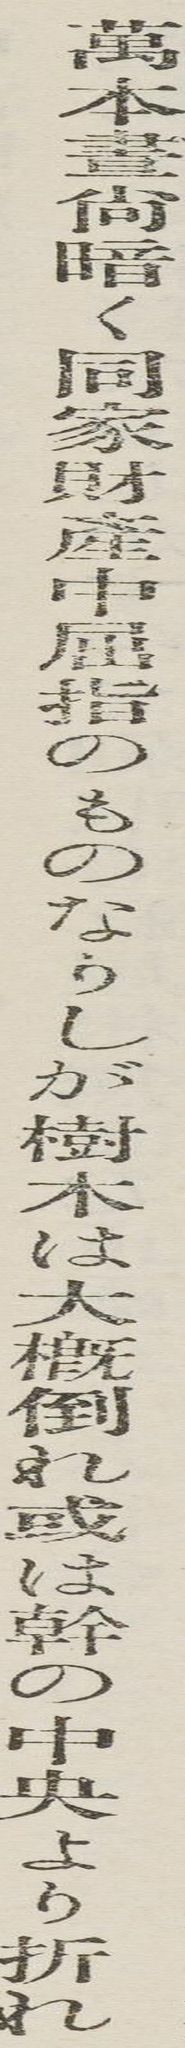万本昼尚暗く同家財産中屈指のものなりしが樹木は大概倒れ或は幹の中央より折れ
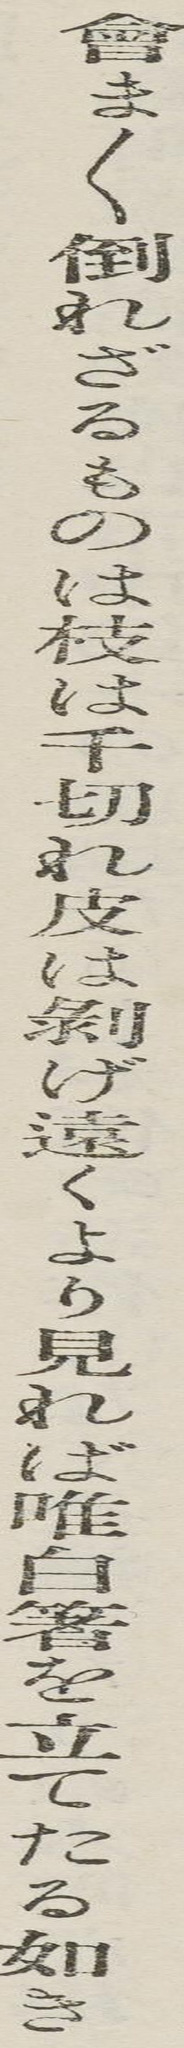会ま〳〵倒れざるものは枝は千切れ皮は剥げ遠くより見れば唯白箸を立てたる如き
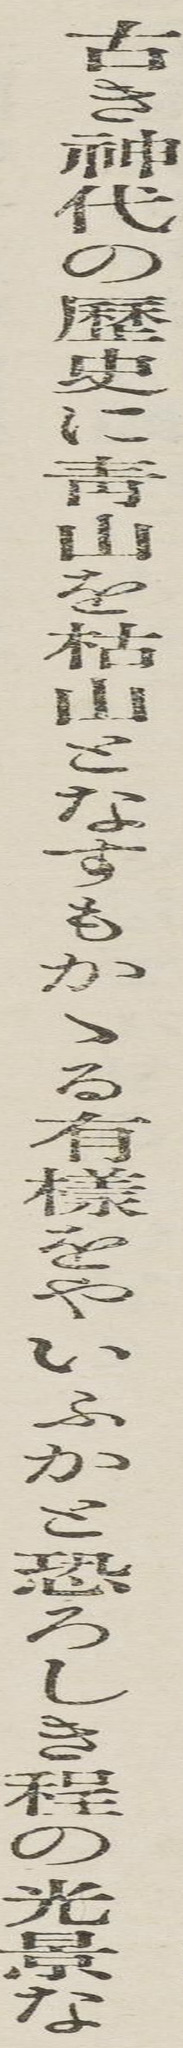古き神代の歴史に青山を枯山となすもかゝる有様をやいふかと恐ろしき程の光景な
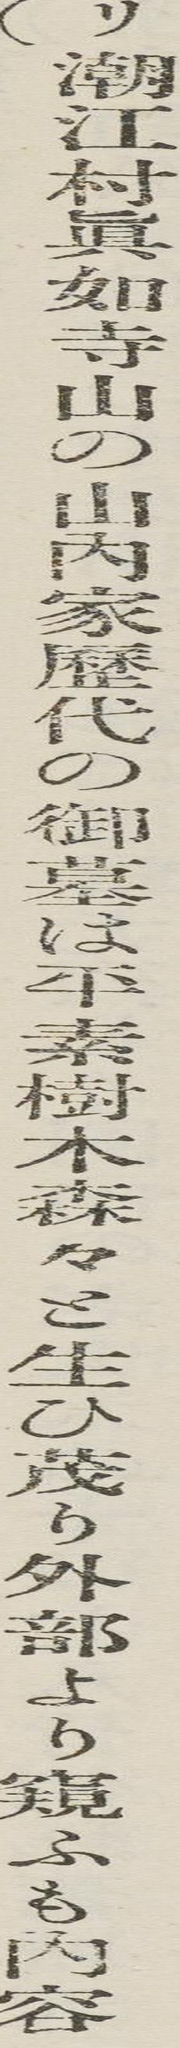潮江村真如寺山の山内家歴代の御墓は平素樹木森々と生ひ茂り外部より窺ふも内容
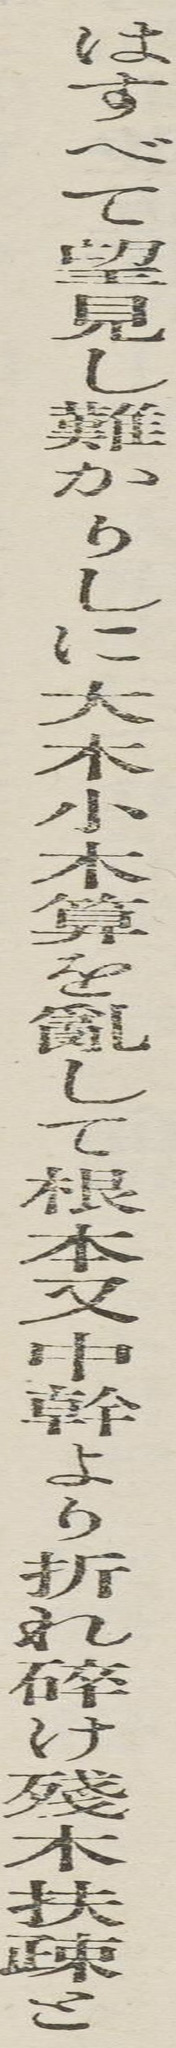はすべて望見し難かりしに大木小木算を乱して根本又中幹より折れ砕け残木扶疎と
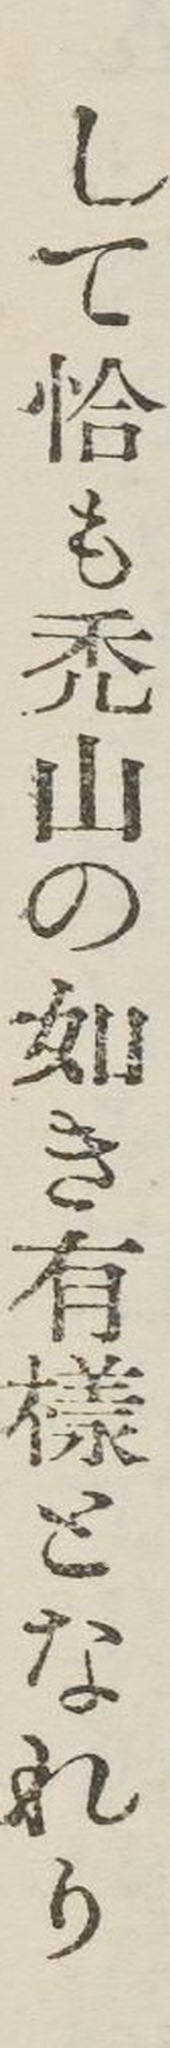して恰も禿山の如き有様となれり
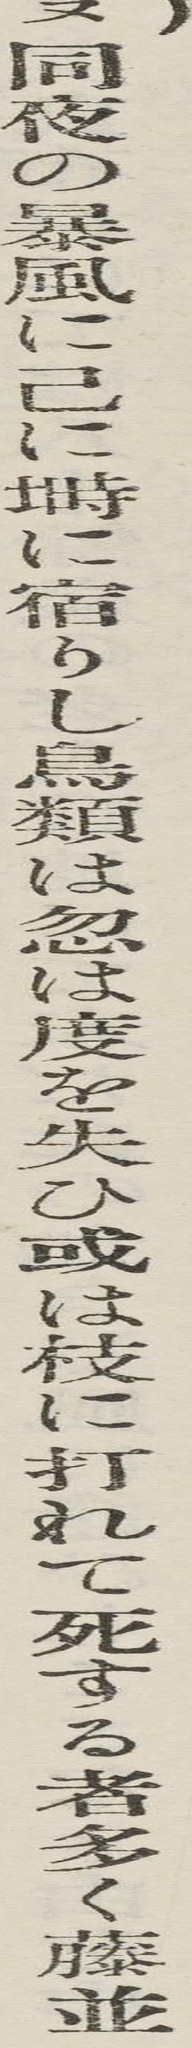同夜の暴風に己に塒に宿りし鳥類は忽は度を失ひ或は枝に打れて死する者多く藤並
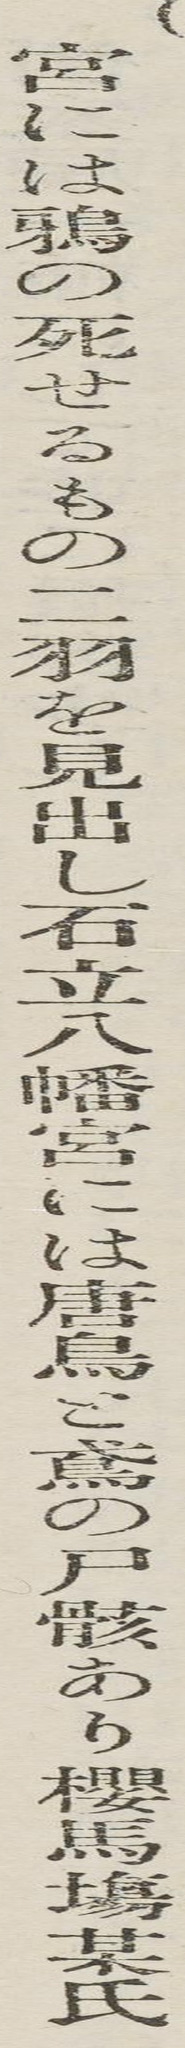宮には鴉の死せる者二羽を見出し石立八幡宮には唐鳥と鳶の尸骸あり桜馬場某氏
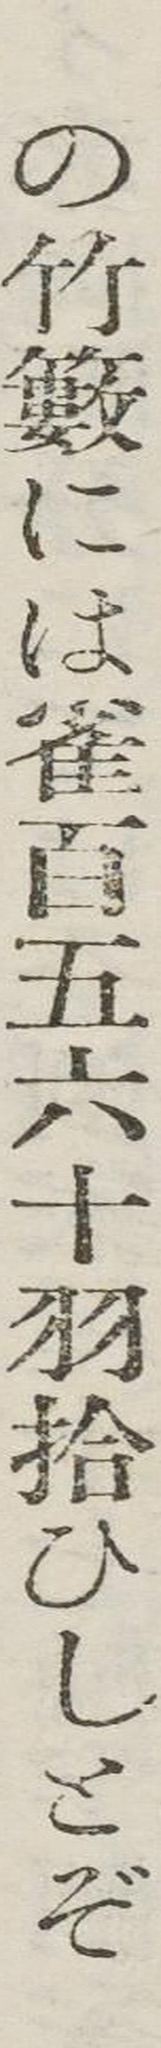の竹藪には雀百五十六羽拾ひしとぞ
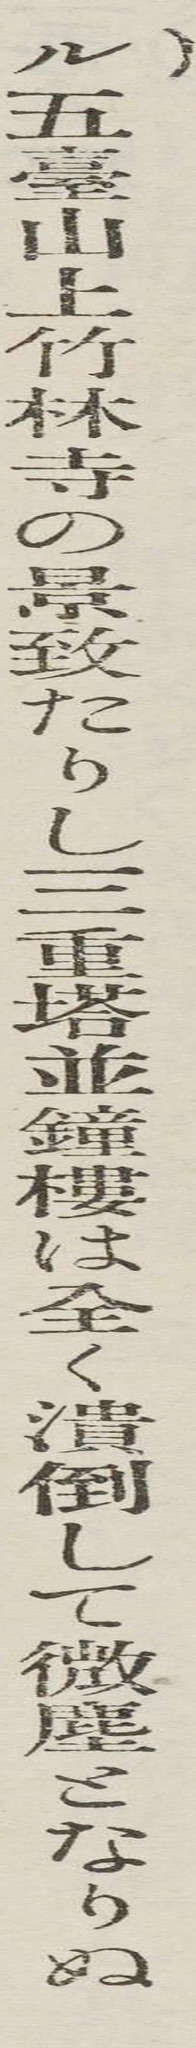五台山上竹林寺の景致たりし三重塔並鐘楼は全く潰倒して微塵となりぬ
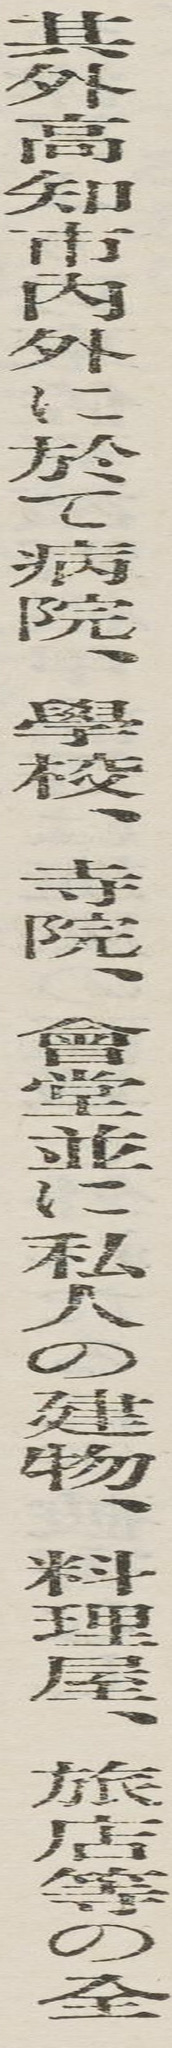其外高知市内外に於て病院、学校、寺院、会堂並に私人の建物、料理屋、旅店等の全
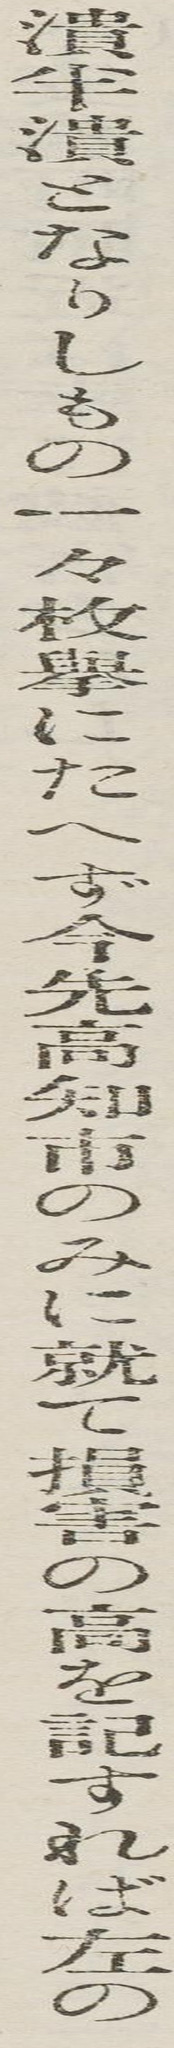潰半潰となりしもの一々枚挙にたへず今先高知市のみに就て損害の高を記すれば左の
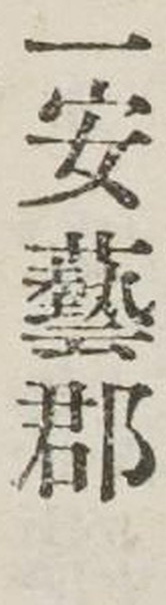安芸郡

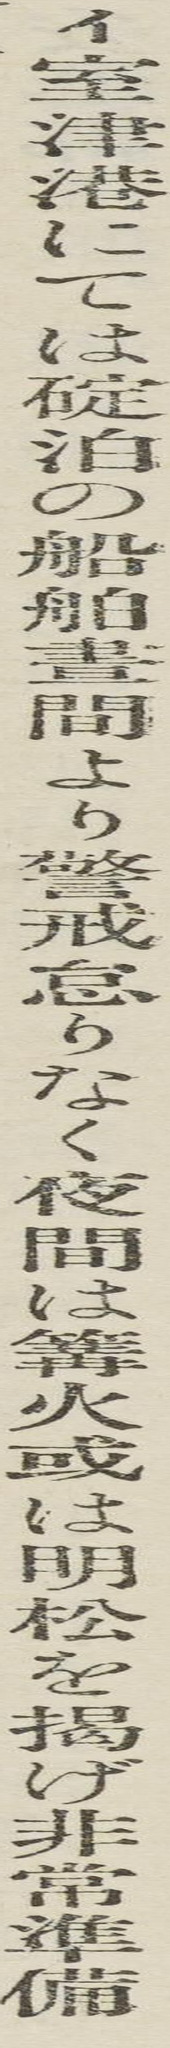室津港にては碇泊の船舶昼間より警戒怠りなく夜間は篝火或は松明を掲げ非常準備
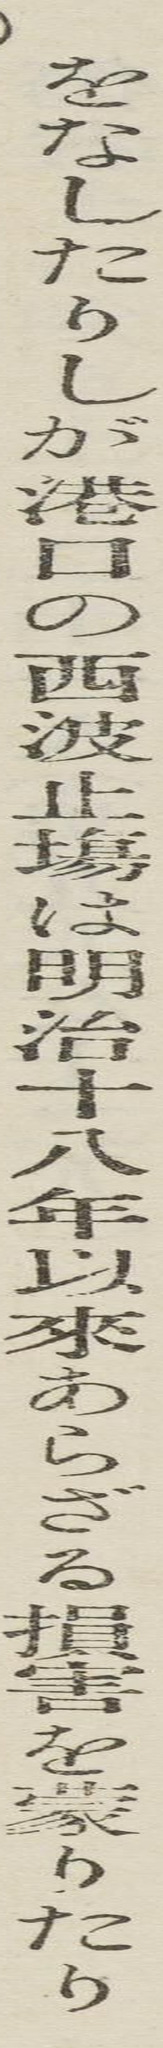をなしたりしが港口の西波止場は明治十八年以来あらざる損害を蒙りたり
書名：土佐古今ノ地震
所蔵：東京大学地震研究所図書室 Earthquake Research Institute Library, The University of Tokyo, JAPAN
